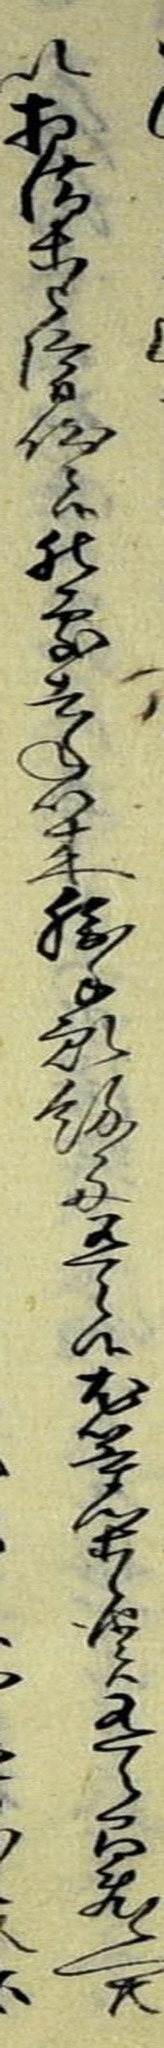以拝借等被仰付儀ニ候然処去年以来勝手願余多有之候尤等閑之儀ニハ有之間敷候へ共
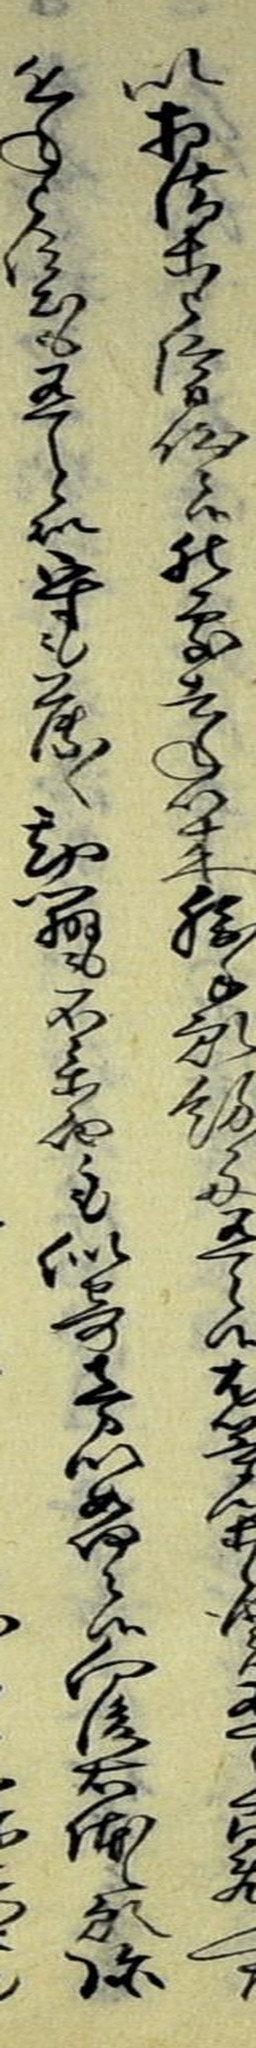近年被仰出も有之候処守も薄く勘弁も不参届候も似寄旁以如何ニ候向後右体之願弥
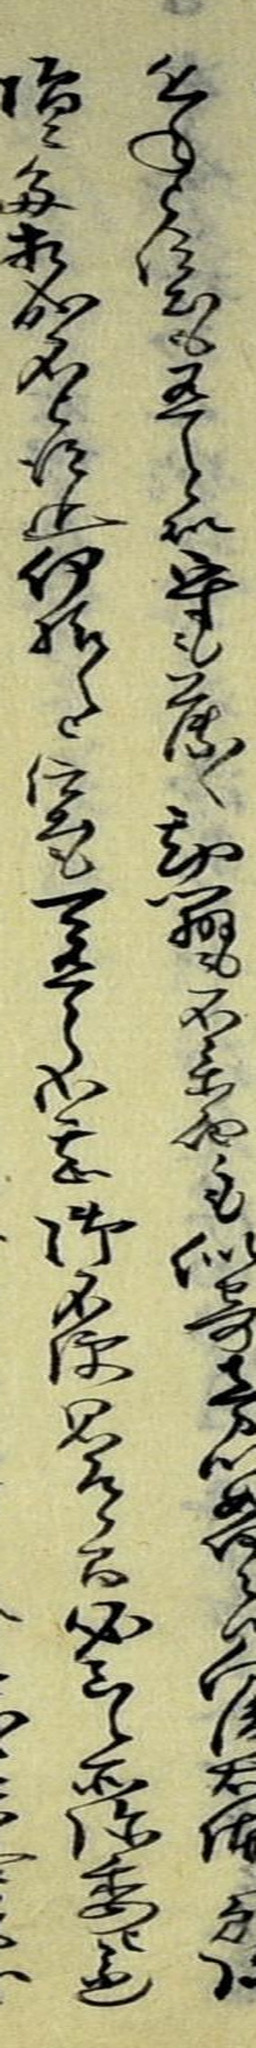増ニ多相成不被得止何様之被仰出も可有之哉甚御不便思召候間必至之所弥委被遂
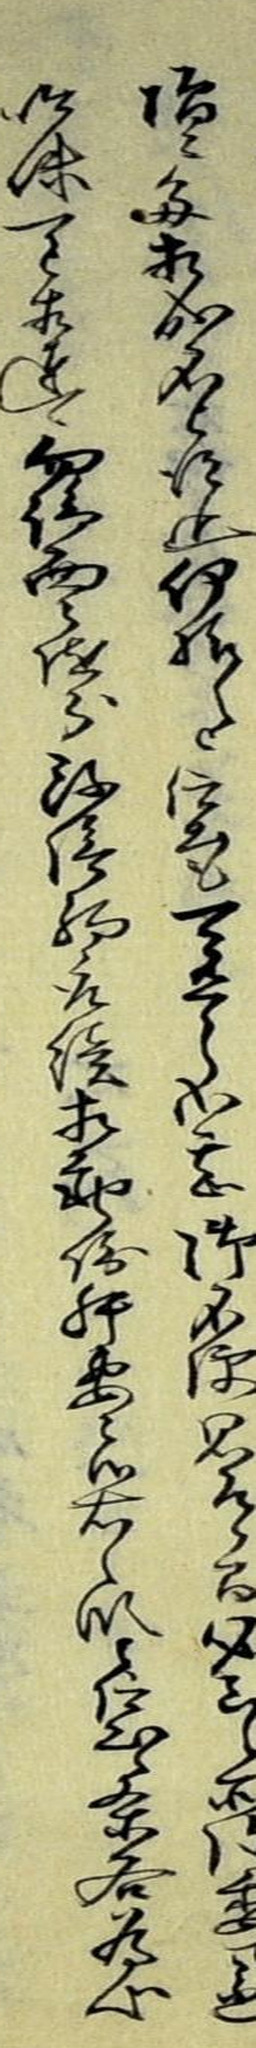吟味可被相達候勿論面々随分致倹約取続相勤候儀肝要ニ候右之段被仰出候条各為心
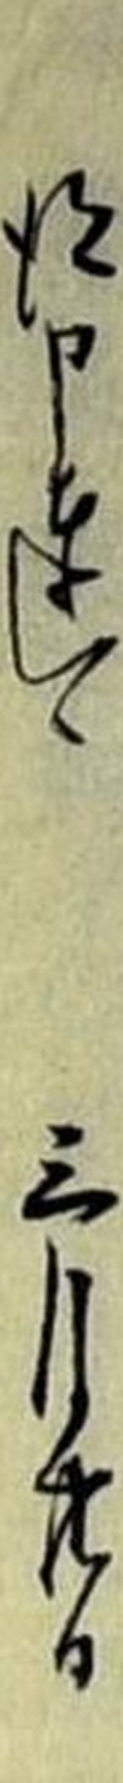得申達候三月廿日
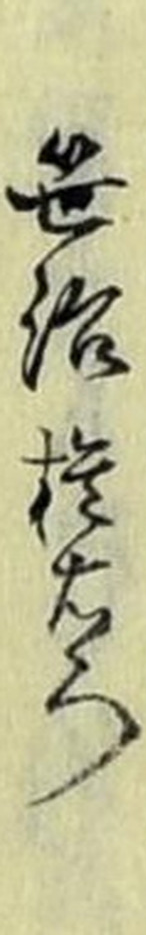笹治権右衛門
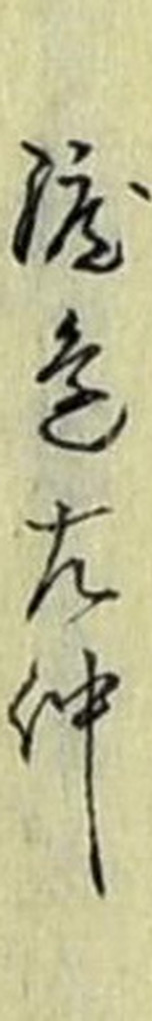渡辺左仲
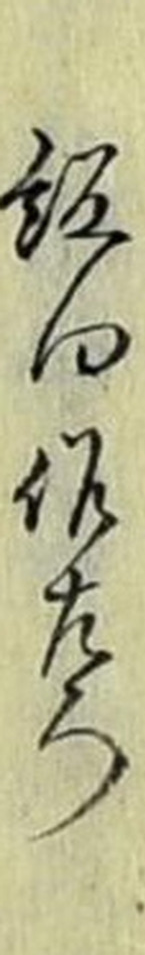飯田作左衛門
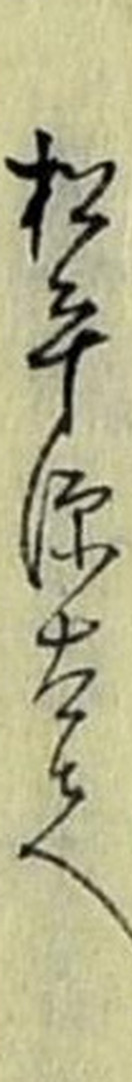松平源太夫
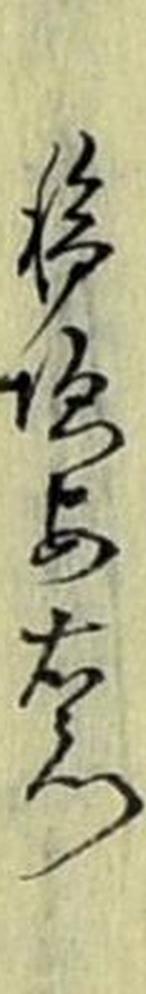稲垣安右衛門
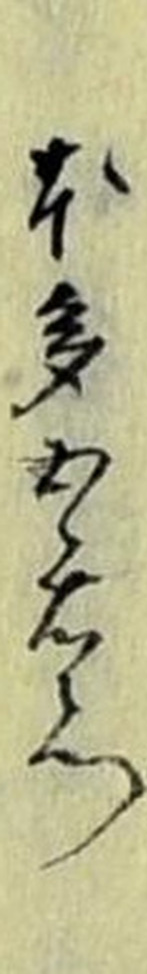本多五郎右衛門
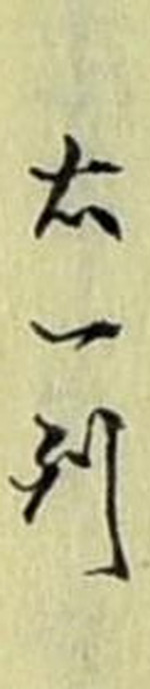右一列

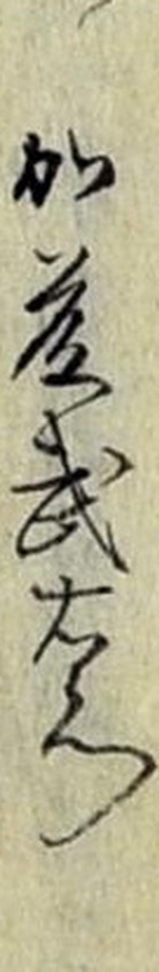加藤武右衛門
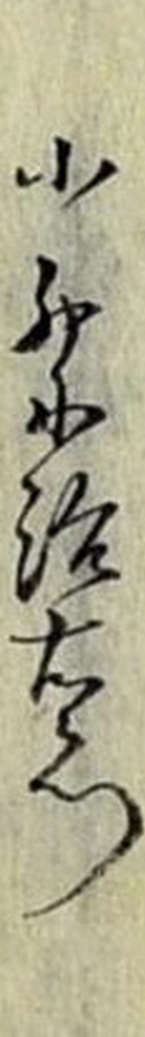小栗治右衛門
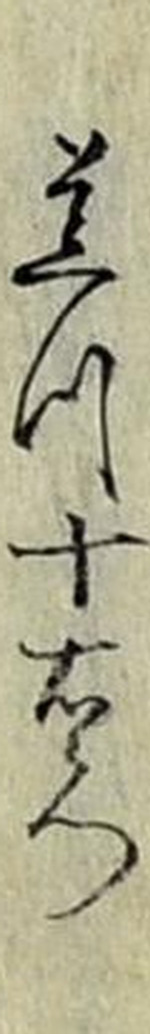荒川十右衛門
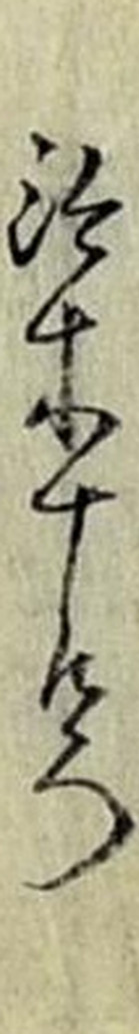鈴木十左衛門
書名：命令之部 一
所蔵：福井県文書館 Fukui Prefectural Archives
